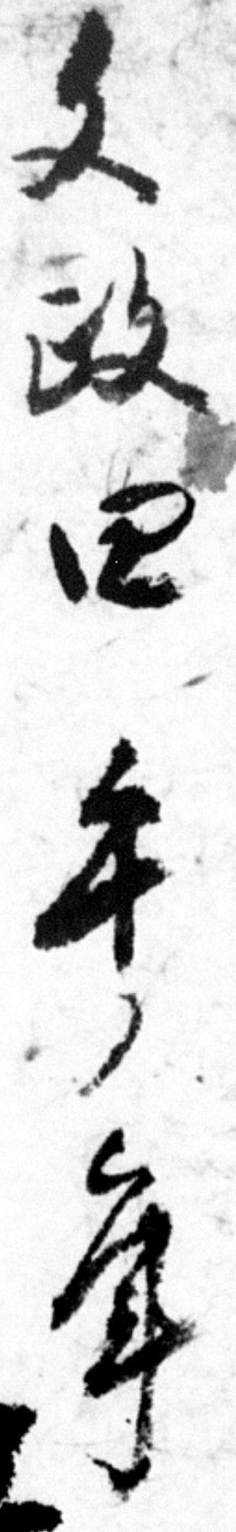文政四午ノ年
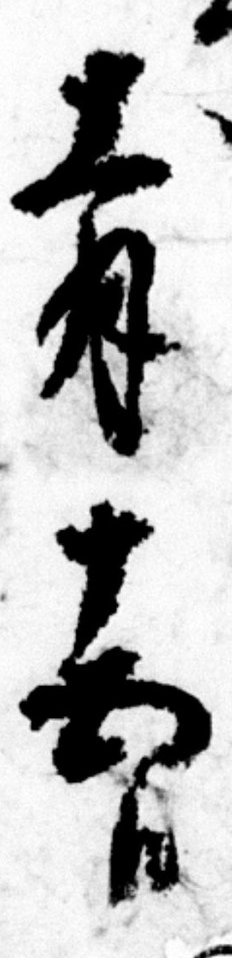十一月十五日
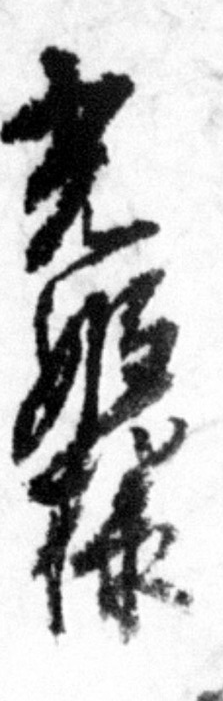光姫様
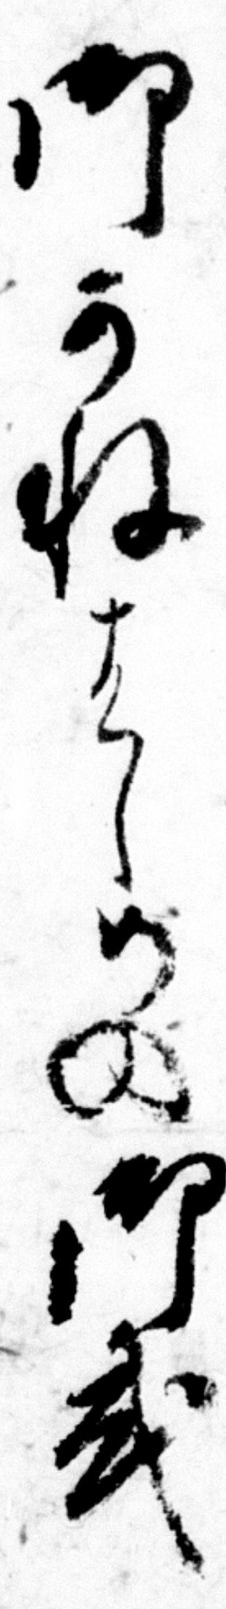御かねはしめの御式

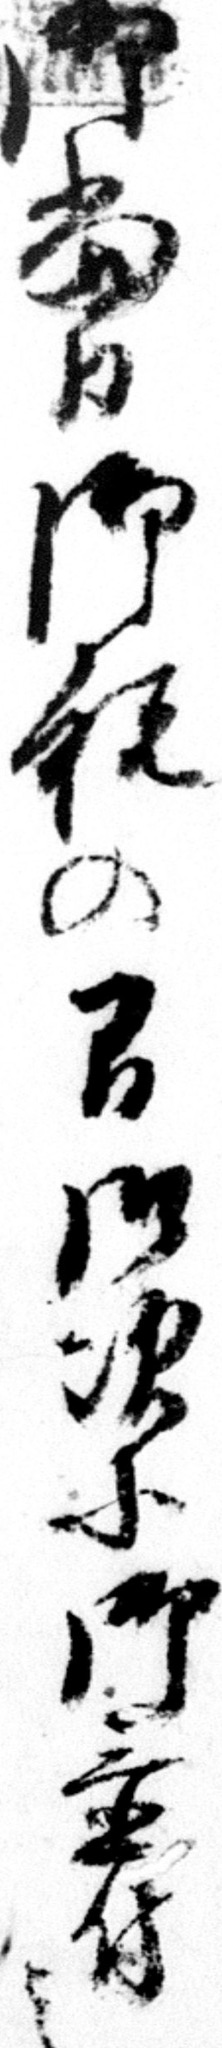御當日御祝の間御次に御置付之
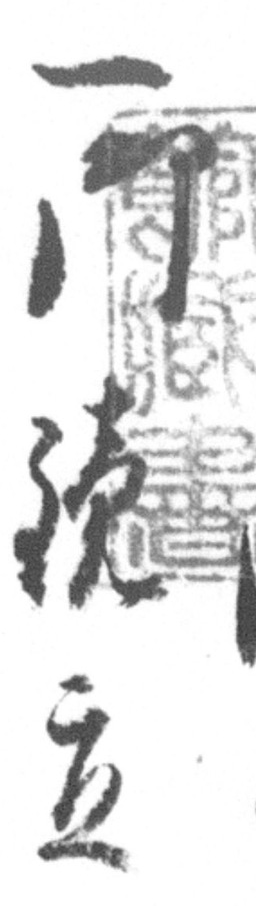一御鏡立
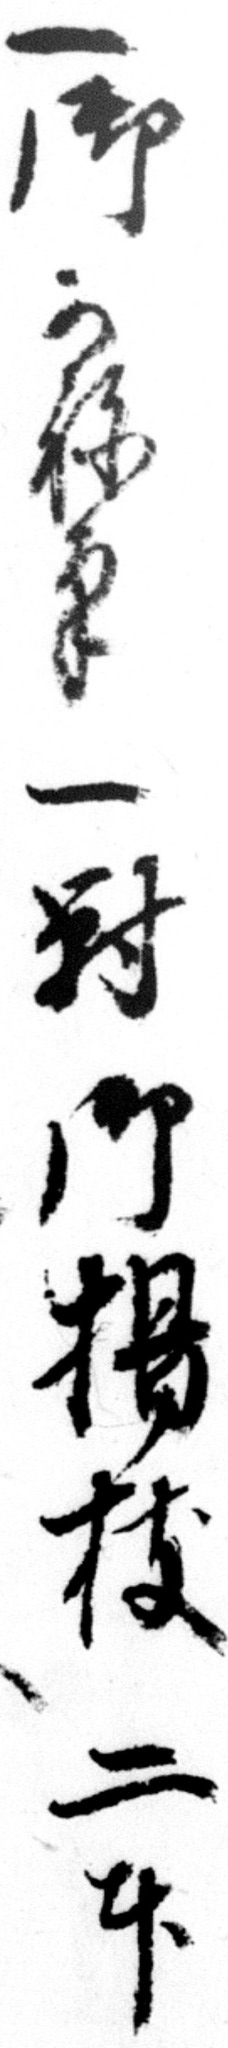一御かね筆一對御楊枝二本
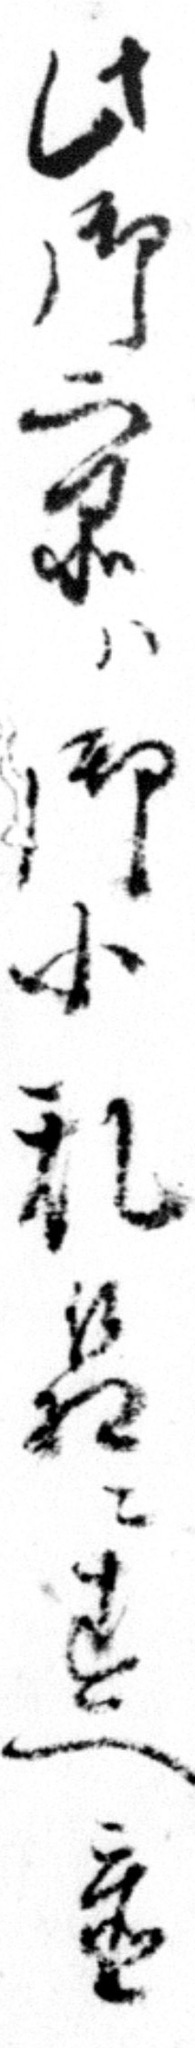此御二品ハ御小乱箱ニすへ置
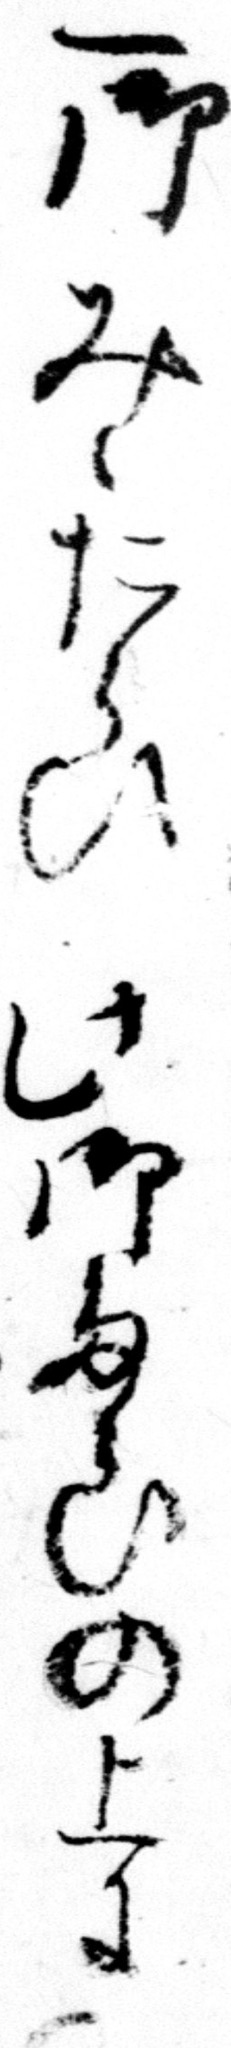一御みゝたらひ此御たらひの上に
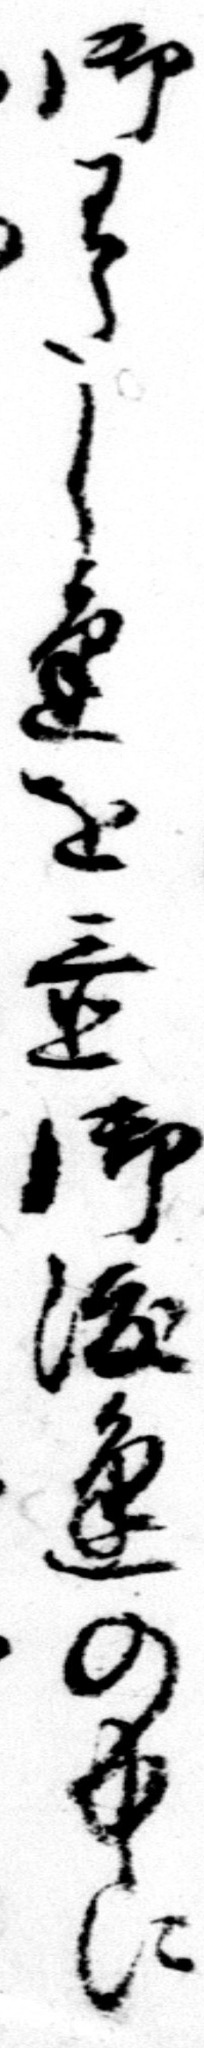御わたし金を置御渡金の中に
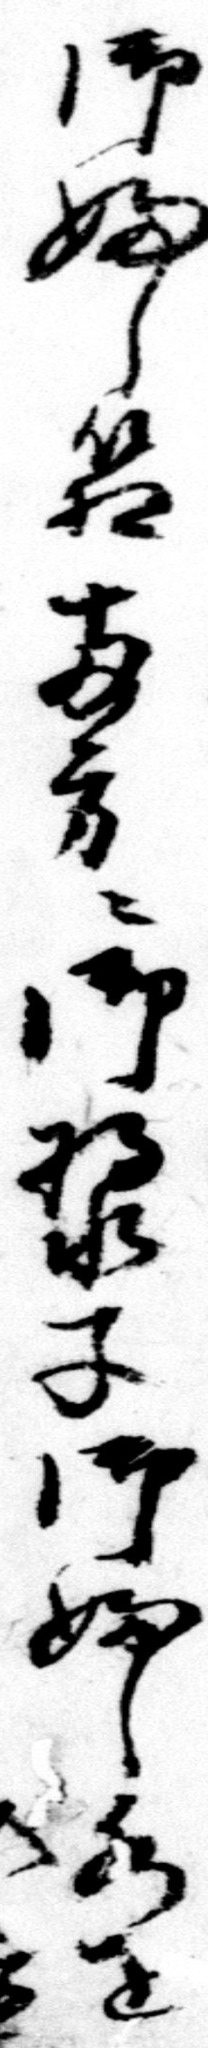御ふし箱両方ニ御漿子御ふし水を入置

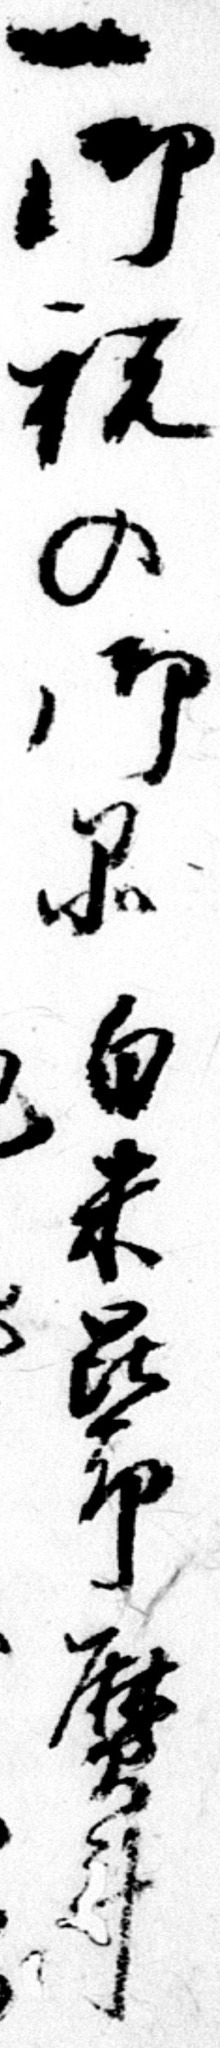一御祝の御品白米昆布熨斗
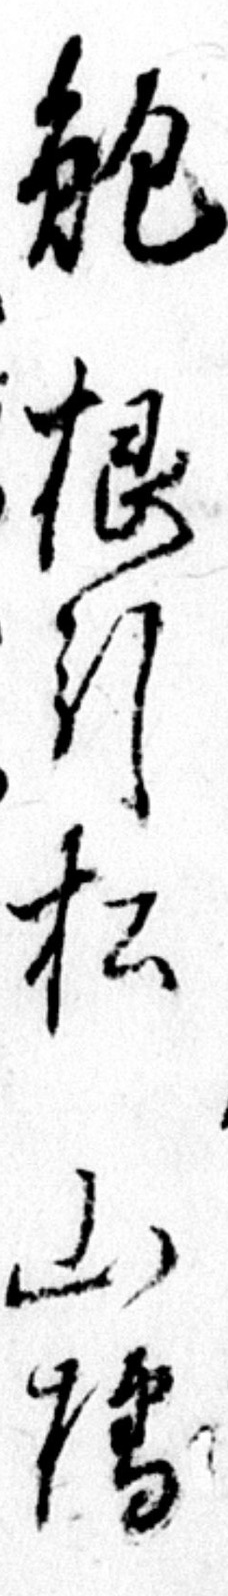鮑根引松山橘
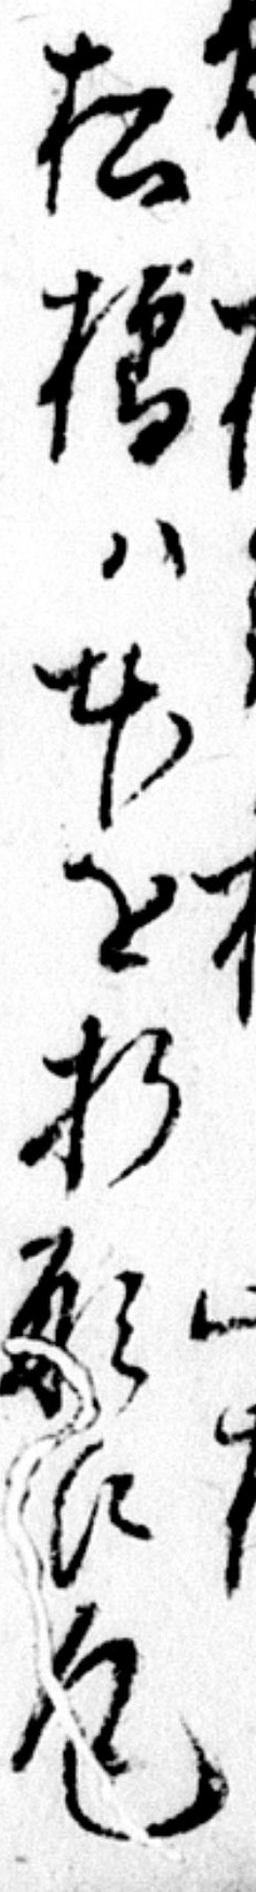松橘ハ本を折形に包
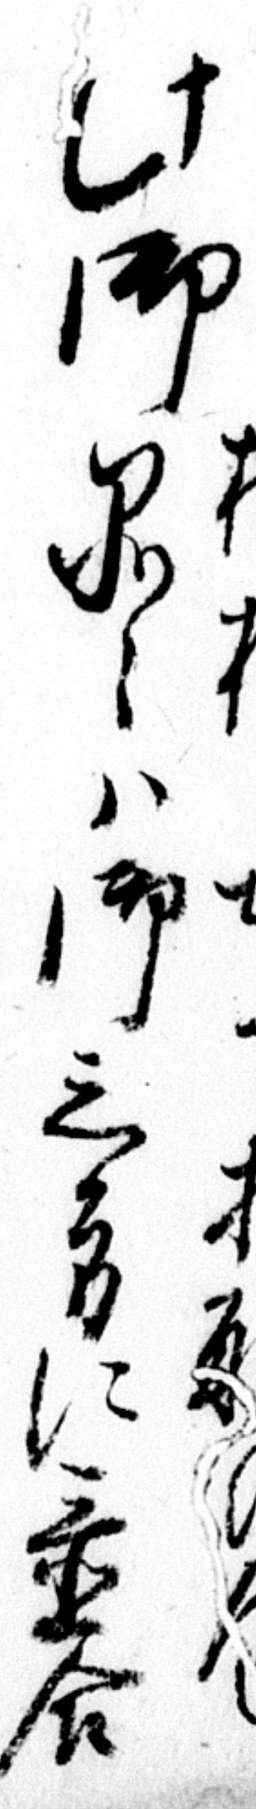此御品々ハ御三方に置合
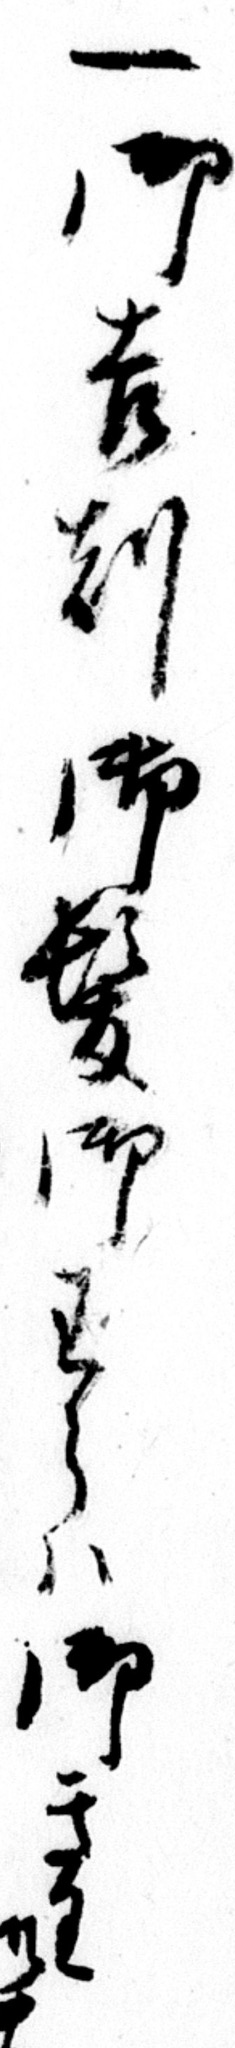一御吉刻御髪御わらハ御きわ御まゆ
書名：光姫様御かねはじめ御式
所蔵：徳島県立図書館
